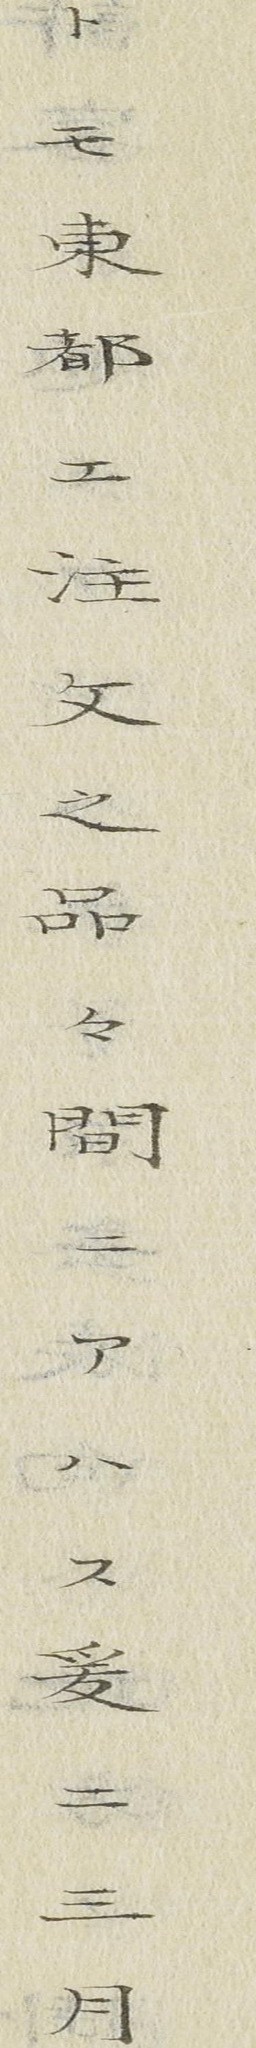トモ東都エ注文之品々間ニアハス爰ニ三月
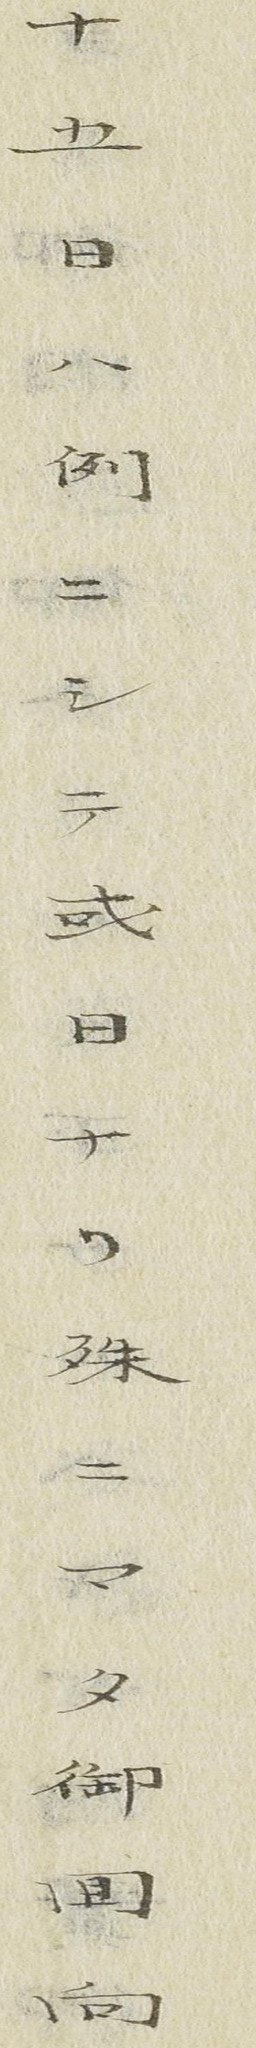十五日ハ例ニシテ或日ナリ殊ニマタ御回向
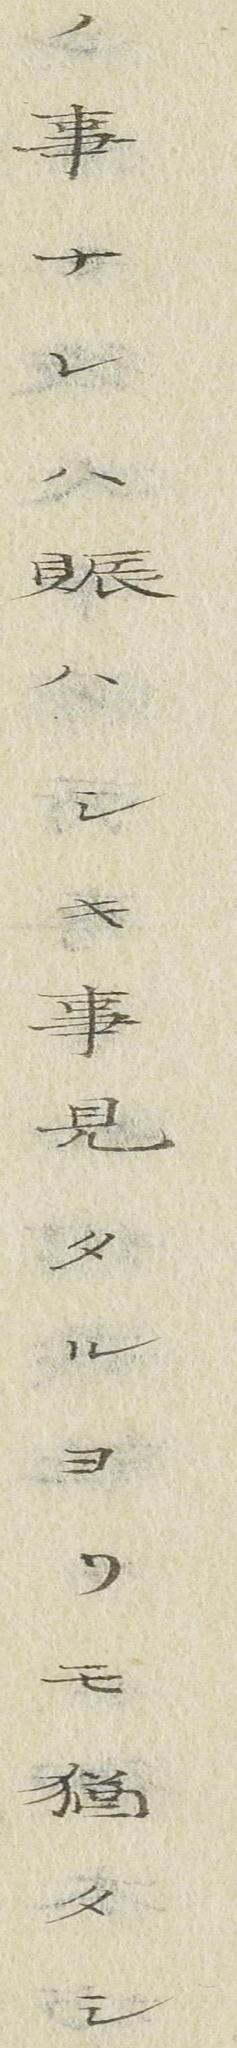ノ事ナレハ賑ハシキ事見タルヨリモ猶タシ
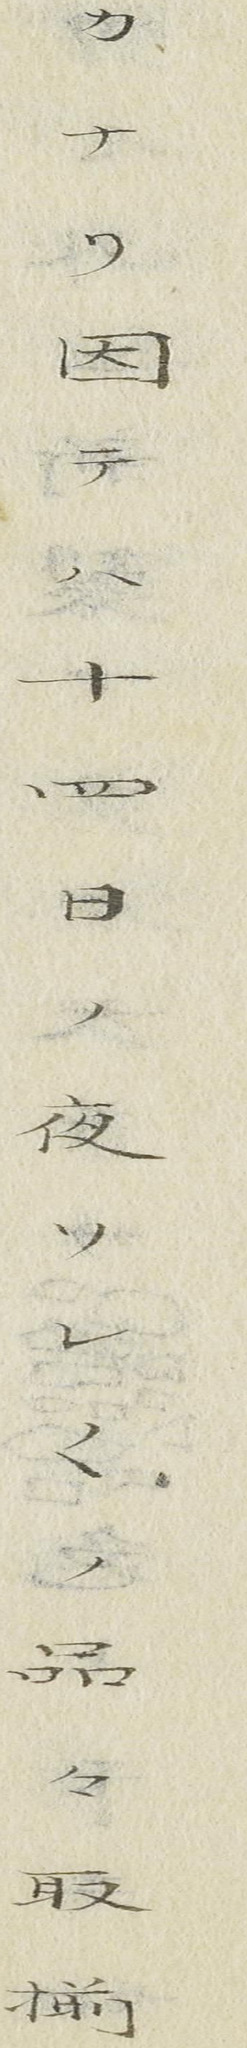カナリ因テハ十四日ノ夜ソレ〱ノ品々取揃
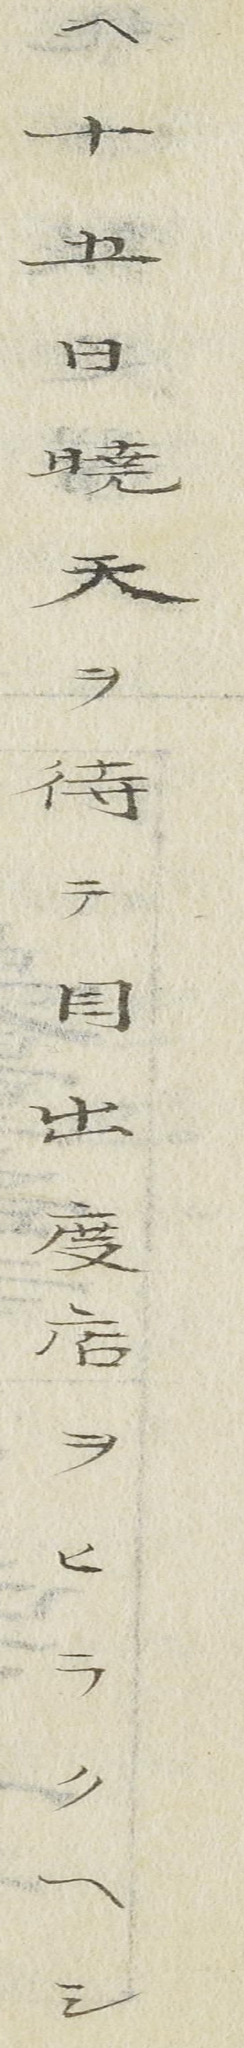ヘ十五日暁天ヲ待テ目出度店ヲヒラクヘシ
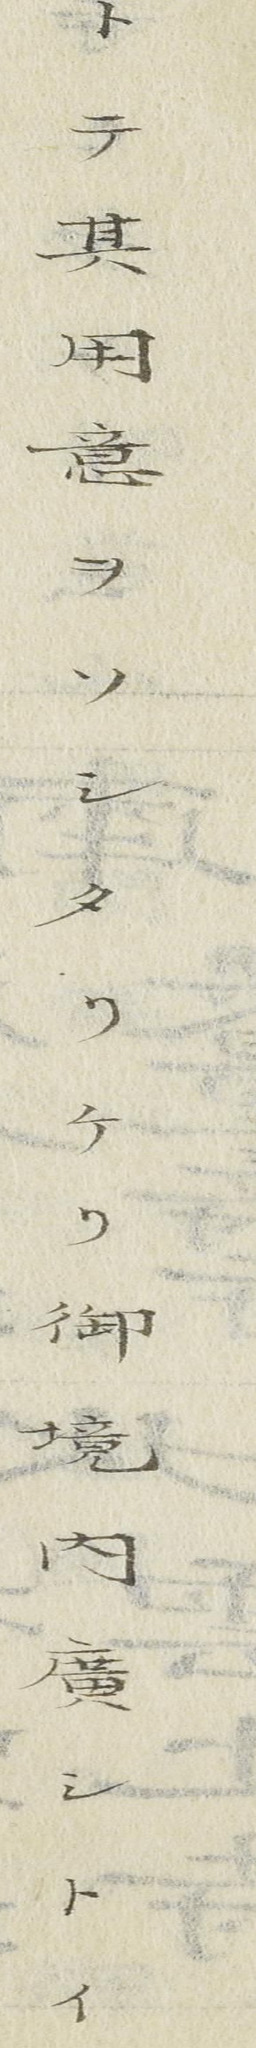トテ其用意ヲソシタリケリ御境内広シトイ
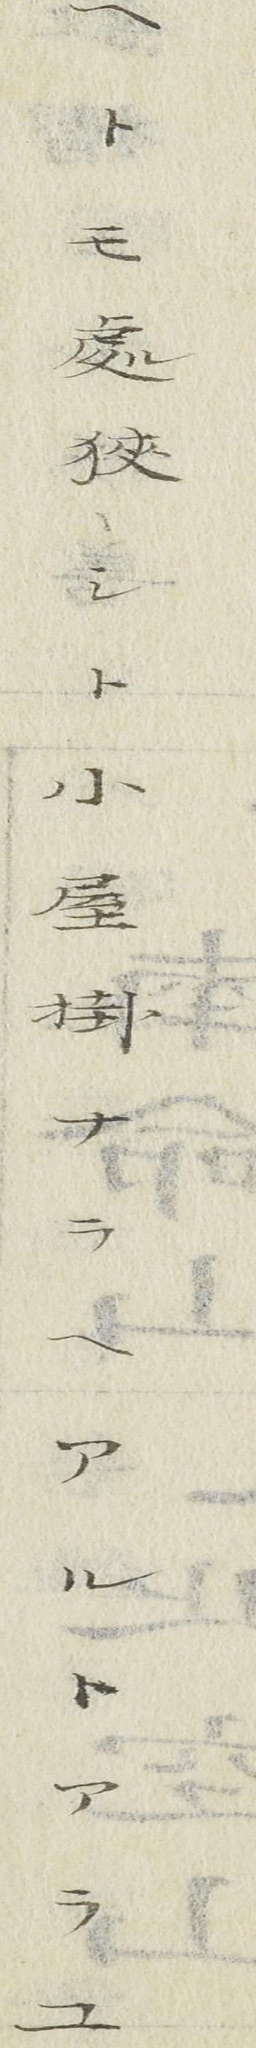ヘトモ処狭シト小屋掛ナラヘアルトアラユ
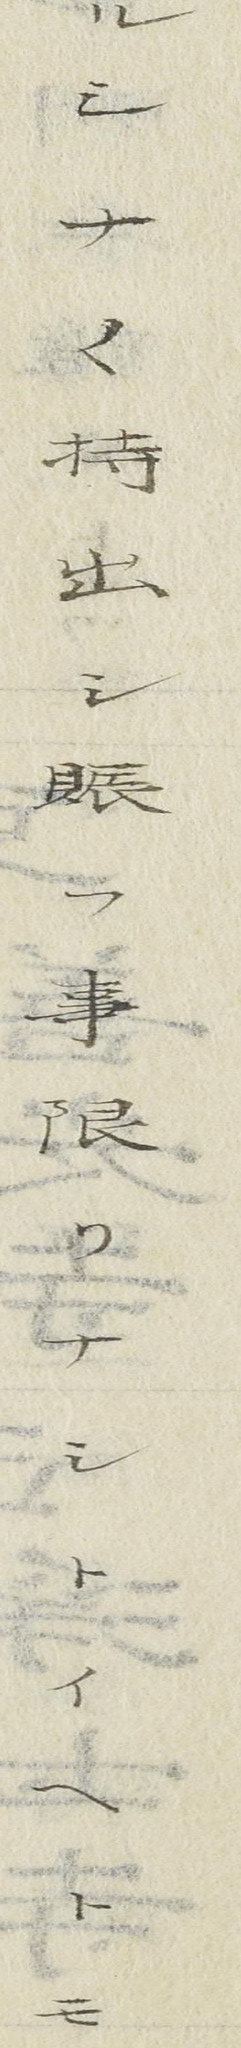ルシナ〱持出シ賑フ事限リナシトイヘトモ
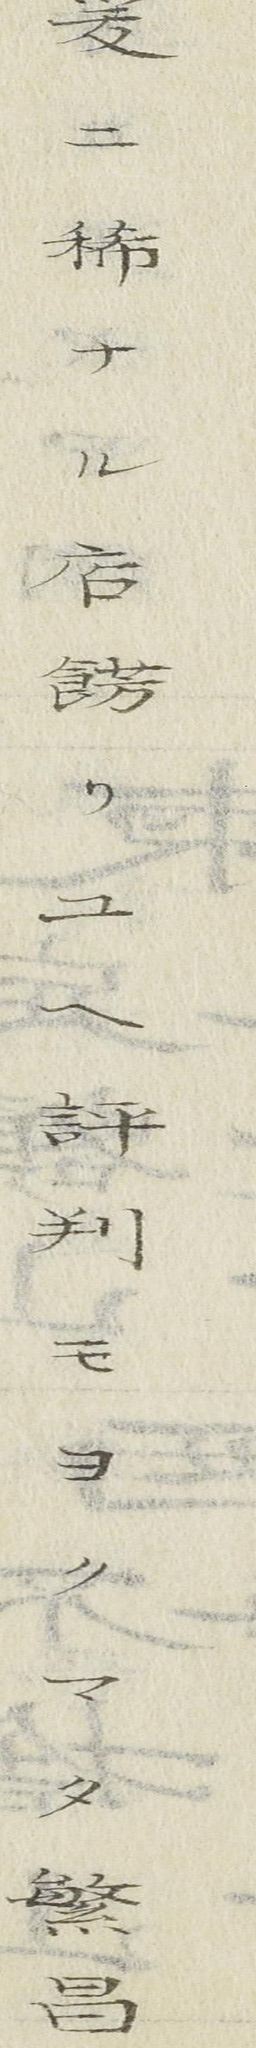爰ニ稀ナル店餝リユヘ評判モヨクマタ繁昌
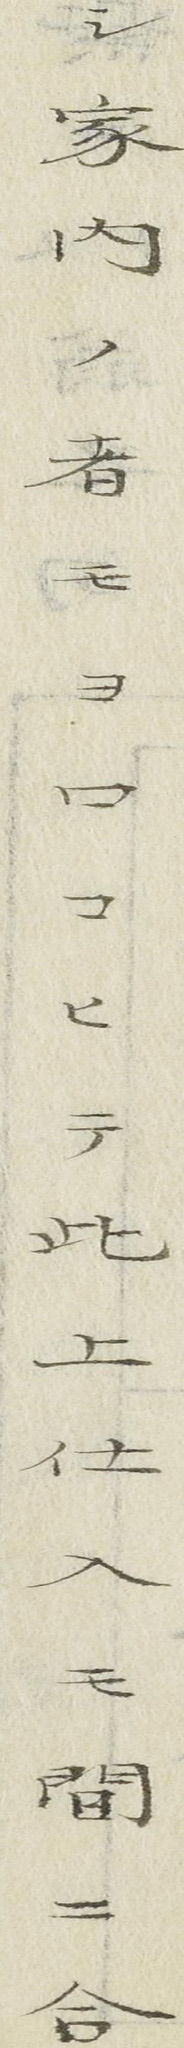シ家内ノ者モヨロコヒテ此上仕入モ間ニ合
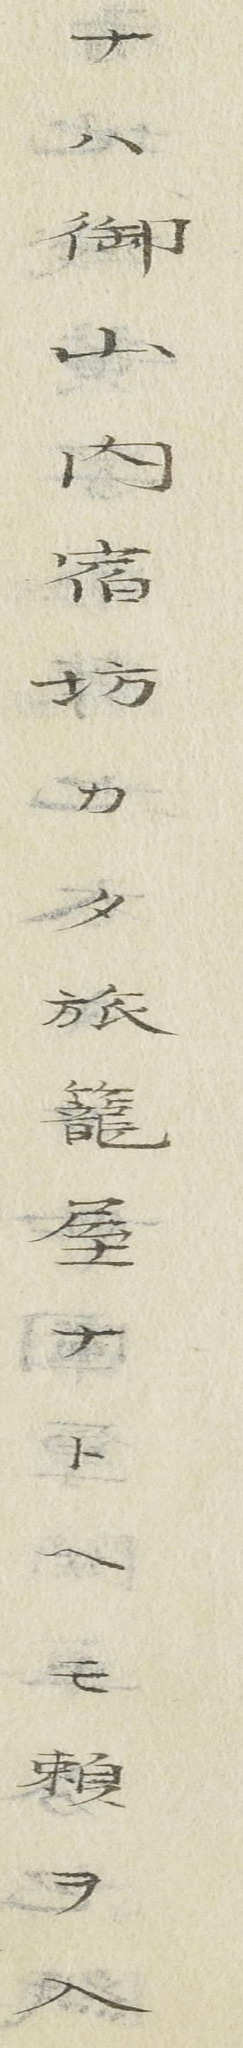ナハ御山内宿坊カタ旅籠屋ナトヘモ頼ヲ入
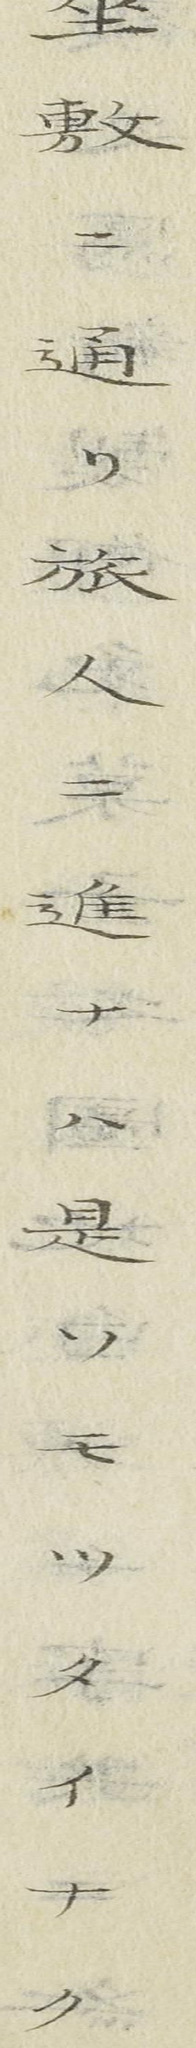座敷ニ通リ旅人ニ進ナハ是ソモツタイナク
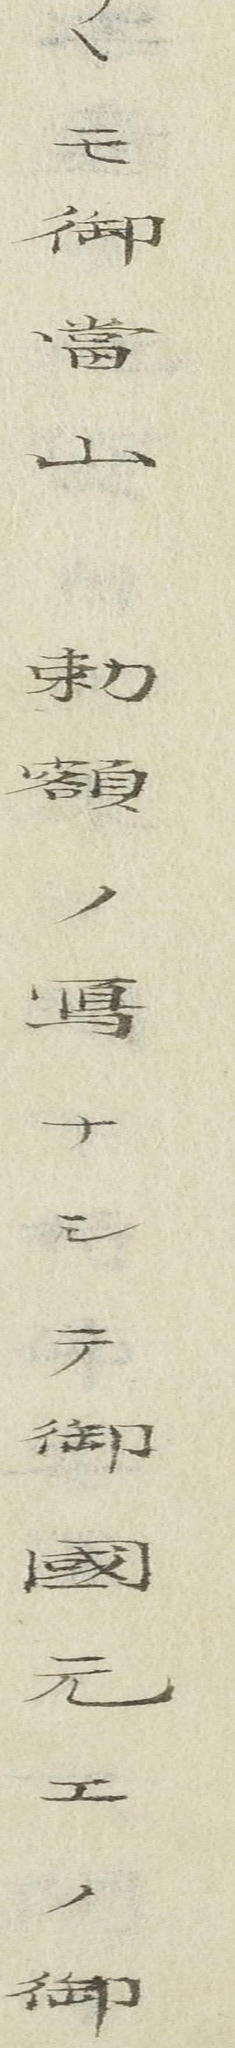〱モ御当山勅額ノ写ナシテ御国元エノ御

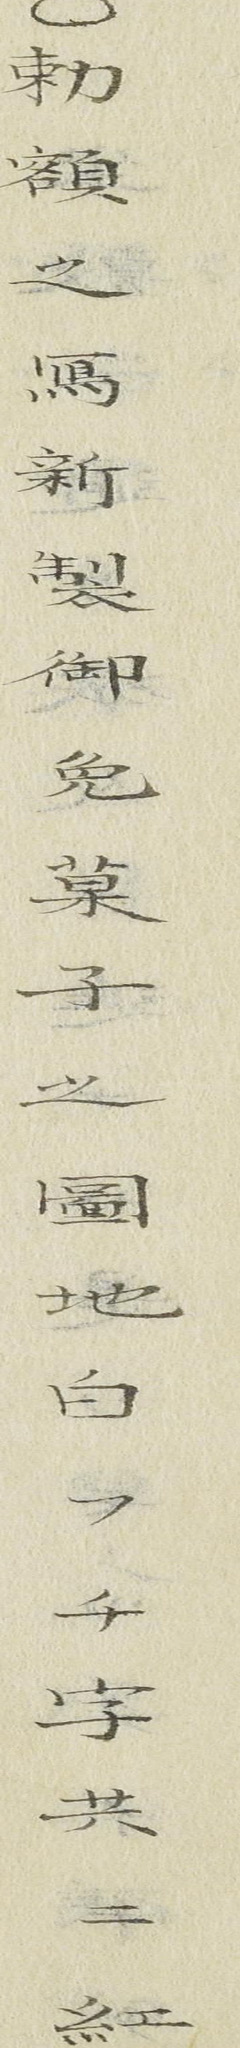〇勅額之写新製御免菓子之図地白フチ字共ニ紅
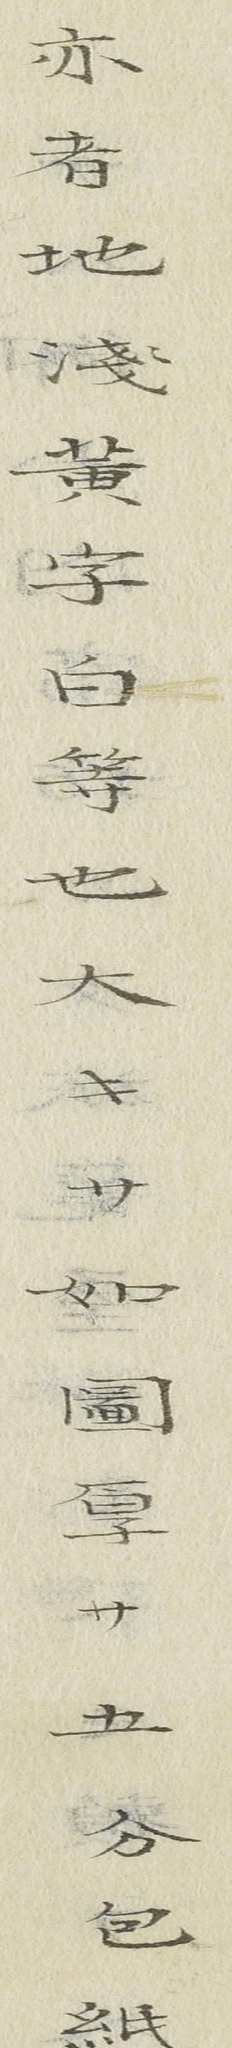亦者地浅黄字白等也大キサ如図厚サ五分包紙
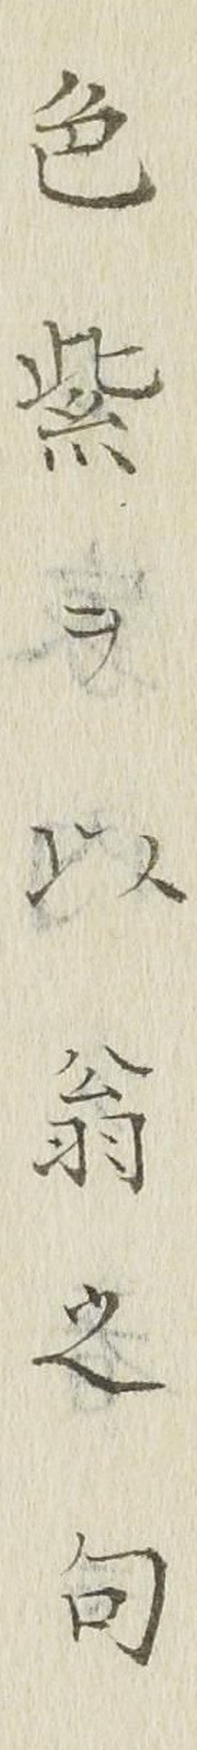色紫ヲ以翁之句
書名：地災撮要　地震之部　巻ノ二
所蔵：東京大学地震研究所図書室 Earthquake Research Institute Library, The University of Tokyo, JAPAN
